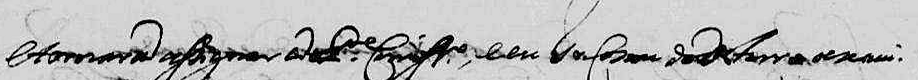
e tornarā assignar e do P.e Comissr.o, e eu Fr. Cosme do Desterro o escreui.
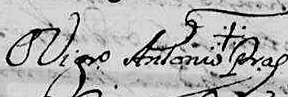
O Vigr.o Antonio Pr.a
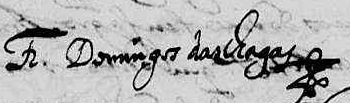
Fr. Domingos das chagas
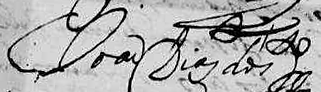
Ioaõ Dias do sto
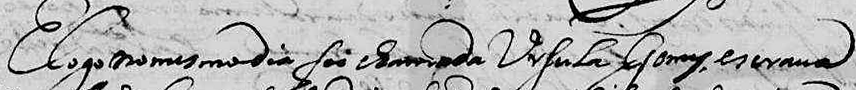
E logo no mesmo dia foi chamada Vrsula Gomes, escraua
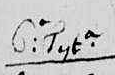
6:a Testa.
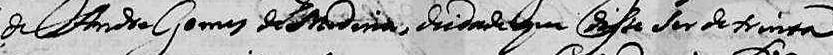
de Andre Gomes de Medina, de idade que disse ser de trinta
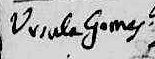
Vrsula Gomes
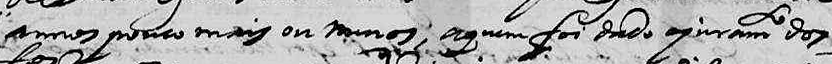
annos pouco mais ou menos; a quem foi dado o juramto dos
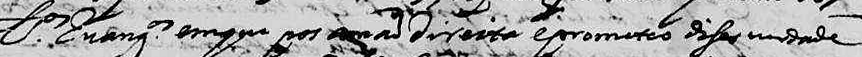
S.tos Euang.os em que pos a maõ direita e prometeo diser uerdade
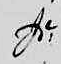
Jde:
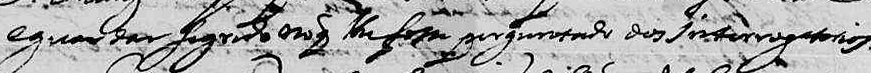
e guardar segredo no q̄ lhe fosse perguntado dos Interrogatorios.
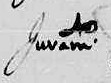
Juram.to
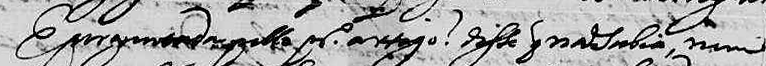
E perguntada pello pr.o artigo? disse q̄ naõ sabia, nem
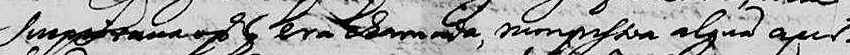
suspeitaua o pa q̄ era chamada, nem pessoa alguā a per
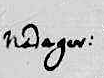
nada ger:
